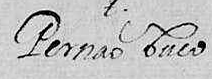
Pernaõbuco
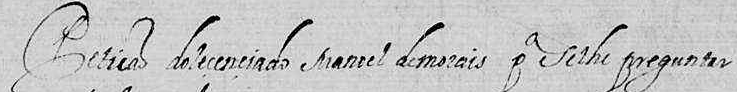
Petiçaõ de lecenciado Manoel de morais pa se lhe preguntar
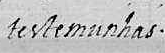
testemunhas.
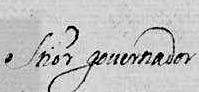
Snor̄ gouernador
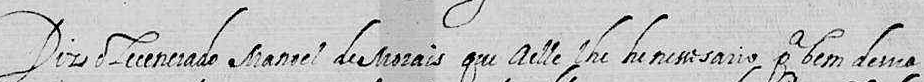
Diz o Lecenciado Manoel de Morais que a elle lhe he nessesario pa bem de sua
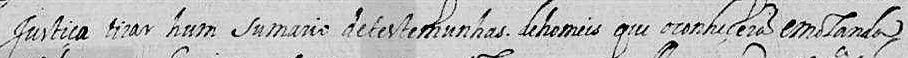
Justiça tirar hum Sumario de testemunhas de homeis que o conheceraõ em olanda
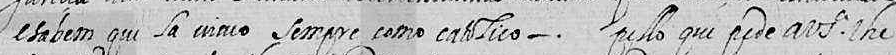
e sabem que la uiueo Sempre como catolico -. pello que pede a V S.a lhe
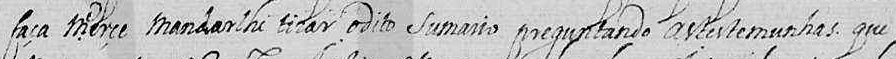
faça merce mandarlhe tirar o dito Sumario preguntando as testemunhas que
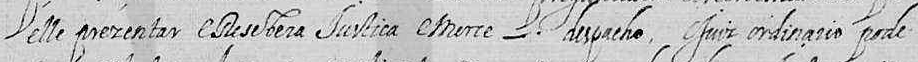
elle prezentar e Resebera Justiça e merce -. despacho o Juiz ordinario pode
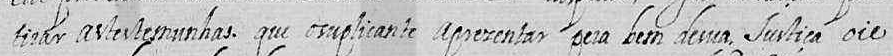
tirar as testemunhas que o suplicante aprezentar pera bem de sua Iustiça oie
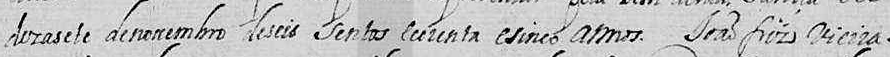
dezasete de nouembro de seissentos e corenta e sinco annos. Joaõ frz̄ vieira
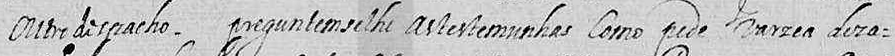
outro despacho. preguntemselhe as testemunhas Como pede varzea deza
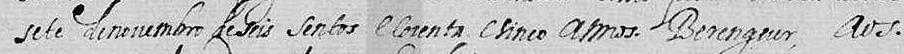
sete de nouembro de seissentos e corenta e sinco annos. Berenguer, aos.
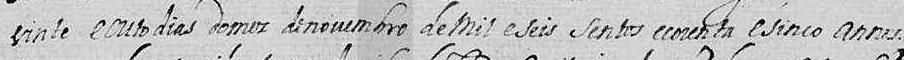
vinte e outo dias do mez de nouembro de mil e seissentos e corenta e sinco annos
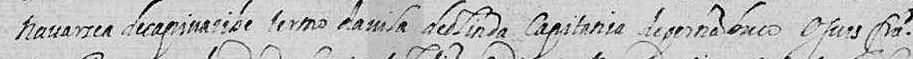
na uarzea de capiuaribe termo da uila de olinda capitania de pernābuco o Juis frā
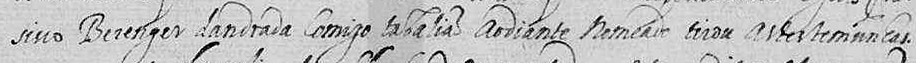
sisco Berenger dandrada Comigo tabaliaõ ao diante nomeado tirou as testemunhas
